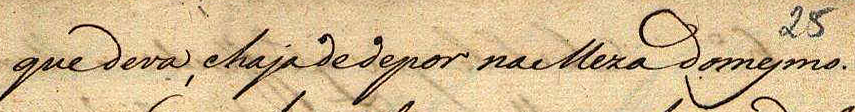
que deva, e haja de depor na Meza do mesmo.
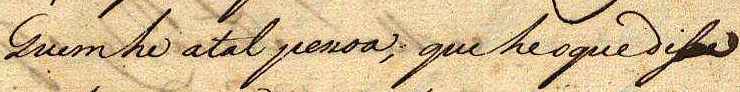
Quem he a tal pessoa; que he o que disse
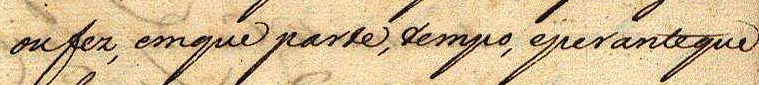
ou fez, em que parte, tempo, e perante que
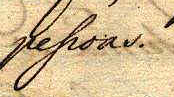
pessoas.
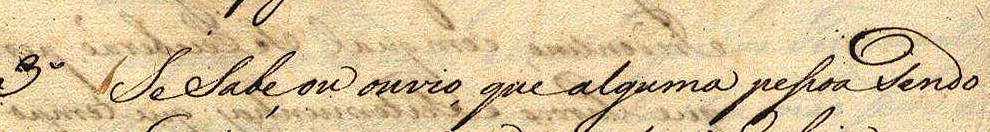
3.o Se Sabe ou ouvio, que alguma pessoa sendo
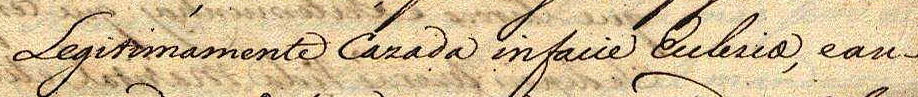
Legitmamente cazada in facie Eccleziæ, e au
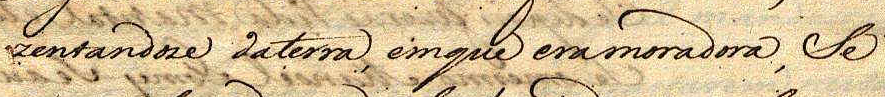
zentandose da terra, em que era moradora, se
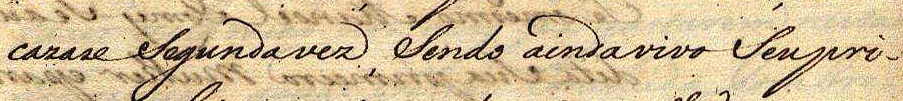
cazase segunda vez, sendo ainda vivo seu pri
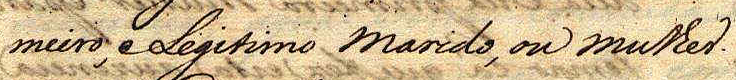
meiro, e Legitimo marido, ou mulher.
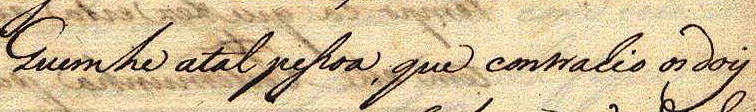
Quem he a tal pessoa, que contrahio os dois
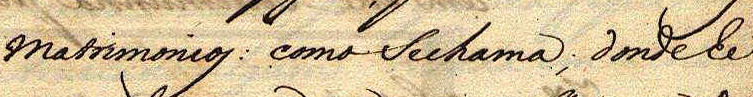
matrimonios: como se chama, donde he
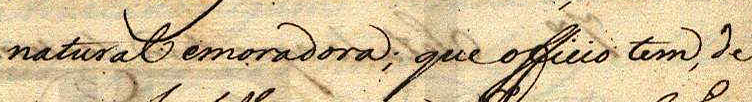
natural e moradora; que officio tem, de
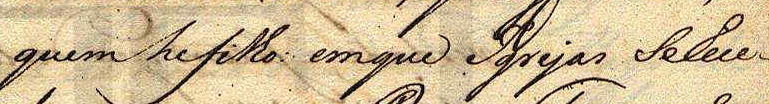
quem he filho: em que Igrejas se Rece
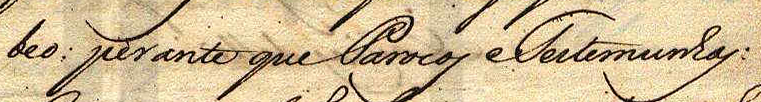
beo: perante que Parocos e Testemunhas:
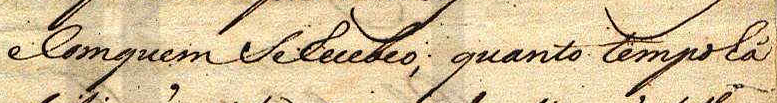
e Com quem se Recebeo; quanto tempo há
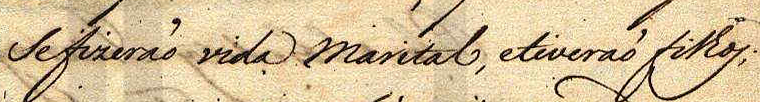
se fizeraõ vida marital, e tiveraõ filhos;
